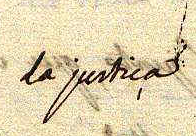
da justiça
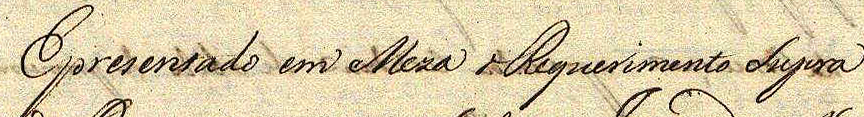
E presentado em Meza o Requerimento Supra
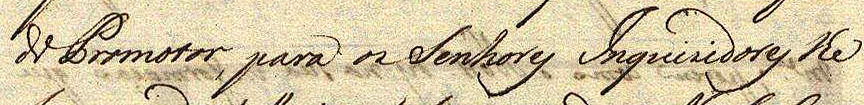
do Promotor, para os Senhores Inquizidores lhe
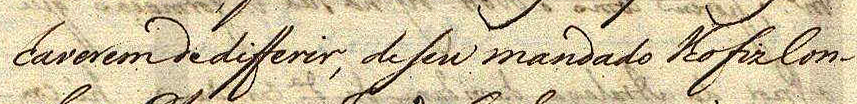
haverem de differir, de seu mandado lho fiz Con
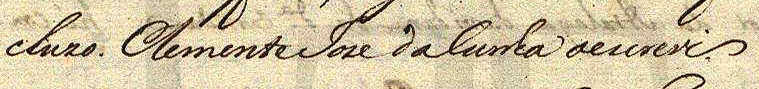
cluzo. Clemente Ioze da Cunha o escrevi
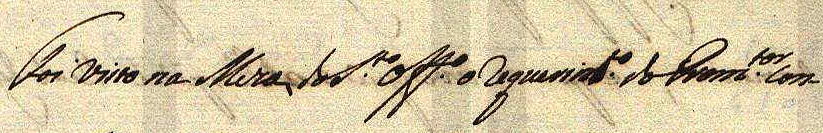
Foi visto na Meza do S.to off.o o Requerimt.o do Prom.tor com
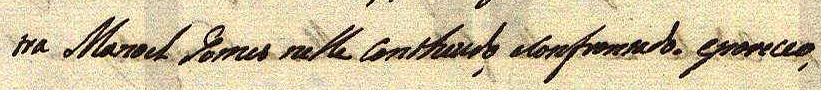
tra Manoel Gomes nelle contheudo, e confrontado. e pareceo,
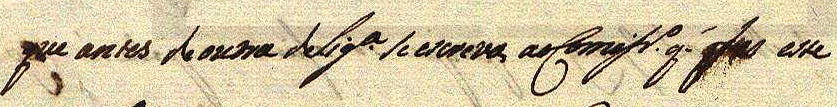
que antes de outra delig.a se escreva ao Comisr.o q̄ fes este
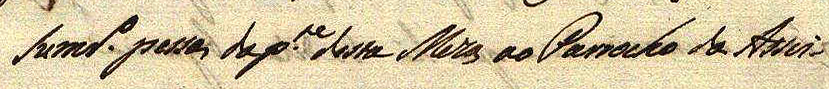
sumr.o pessa da p.te desta Meza ao Parrocho da Assei
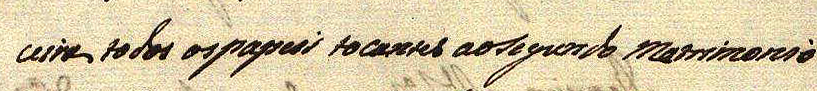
ceira todos os papeis tocantes ao segundo matrimonio
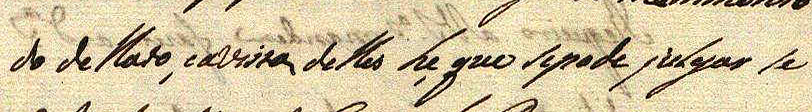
do dellato, e a vista delles he que se pode julgar se
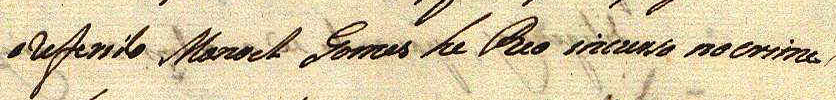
o Refferido Manoel Gomes he Reo incurso no crime
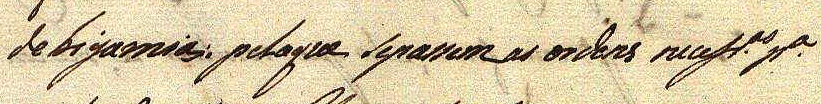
de bigamia: pelo que se passem as ordens necess.as p.a
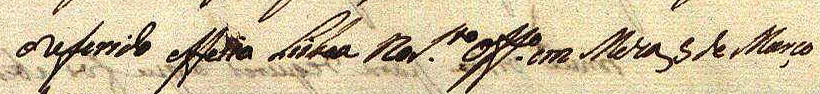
o referido effeito Lisboa no s.to Off.o em Meza, 5 de Março
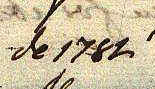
de 1781
